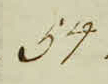54
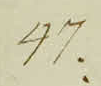47
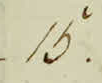15
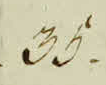35
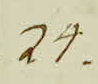24
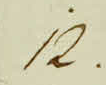12
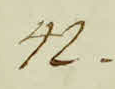42
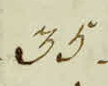35
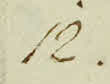12
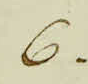6
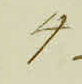4
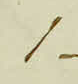1
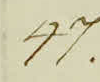47
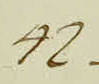42
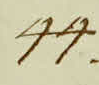44
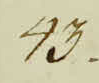43
